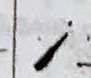1
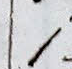1
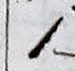1
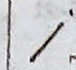1
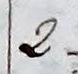2
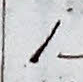1
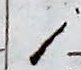1
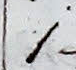1
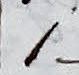1
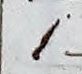1
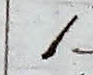1
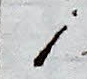1
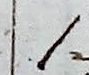1
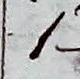1
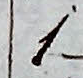1
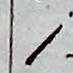1
